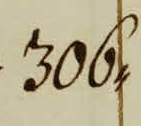306
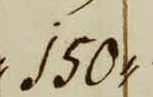150
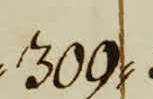309
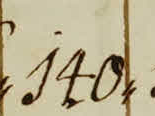140
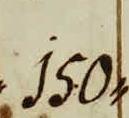150
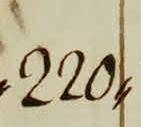220
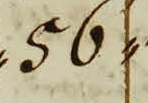56
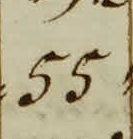55
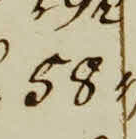58
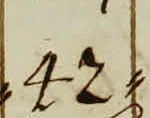42
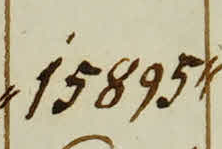15895
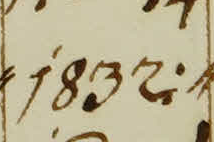1832:
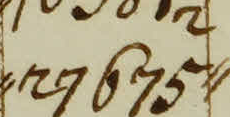27675
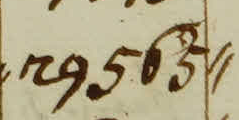29565
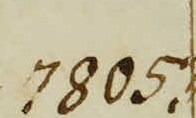7805
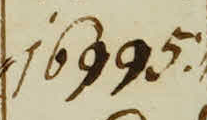16995
